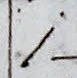1
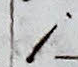1
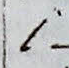1
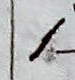1
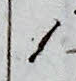1
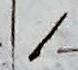1
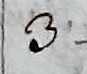3
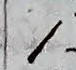1
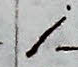1
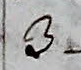3
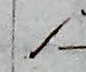1
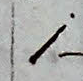1
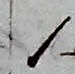1
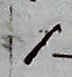1
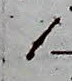1
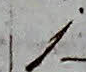1
